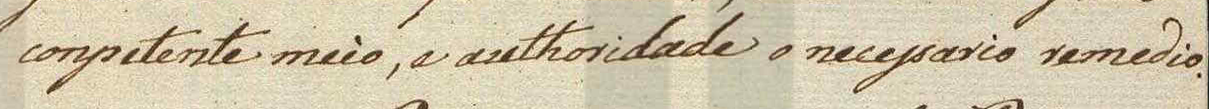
conpetente meio, e authoridade o necessario remedio
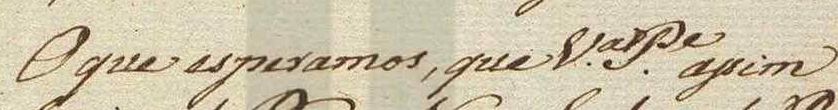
O que esperamos, que V.a P.e assim
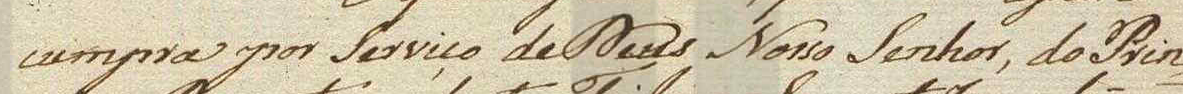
cumpra por Serviço de Deus Nosso Senhor, do Prin
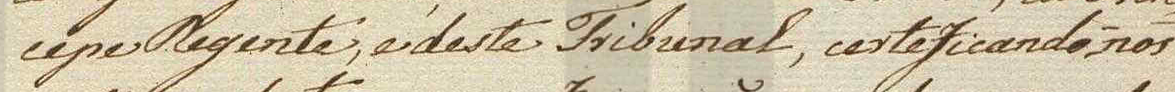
cipe Regente, e deste Tribunal, certeficando nos
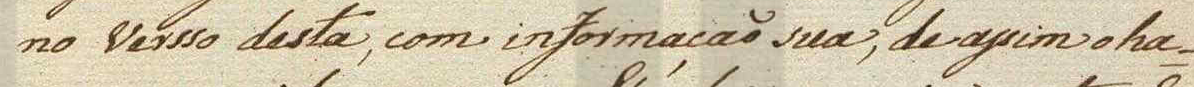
no versso desta, com informaçaõ sua, de assim o ha
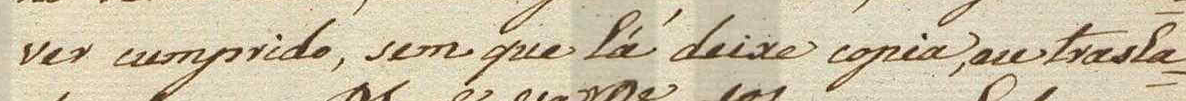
ver cumprido, sem que lá deixe copia, ou trasla
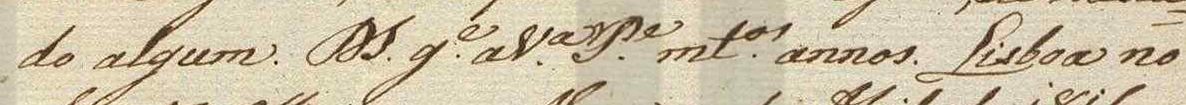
do algum. DS. g.e a V.a P.e mt.os annos. Lisboa no
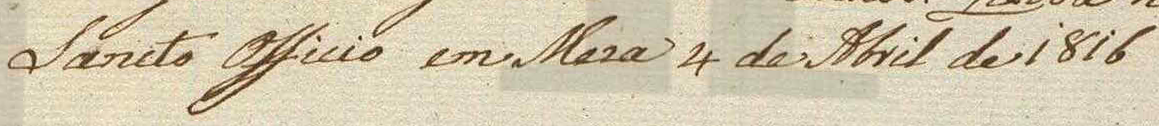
Sancto Officio em Meza 4 de Abril de i8i6
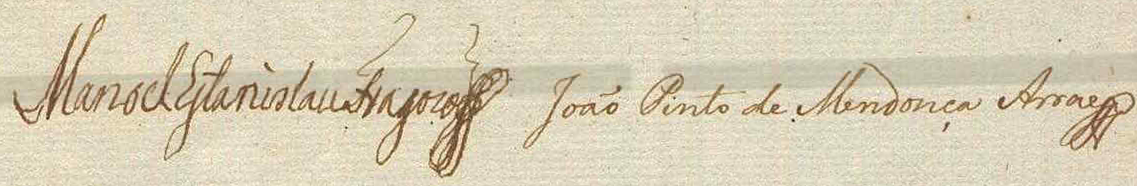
Manoel Estanislau Fragozo Joaõ Pinto de Mendonça Arraes
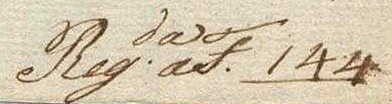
Reg.da a F. 144
